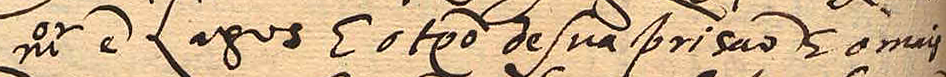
mor ē Lagos E o tp̄o de sua prisão E o mais
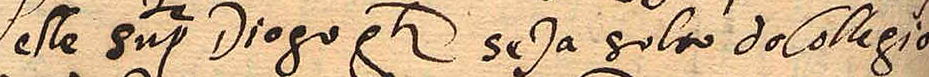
elle supte Diogo ḡlz seJa solto do Collegio
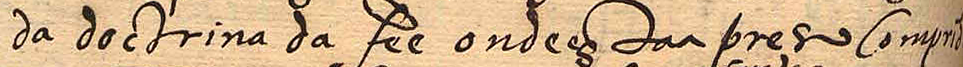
da doctrina da fee onde estaa preso Comprīd
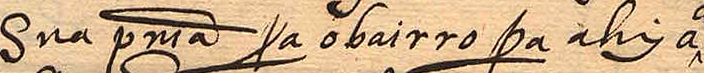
Sua p̄nia ꝑa o bairro ꝑa ahy a
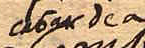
cabar de a
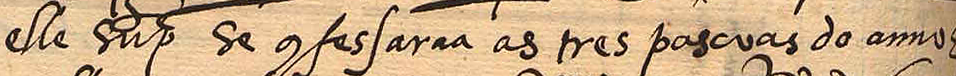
elle supte se ꝯfessaraa as tres pascoas do anno E
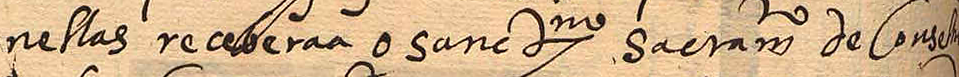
nellas receberaa o sanctmo sacramto de Conselho
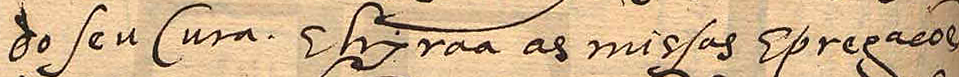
do seu Cura. E hyraa as missas E pregações
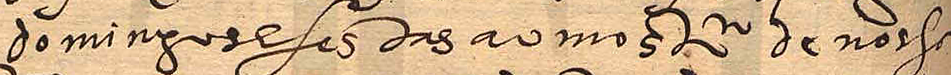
domingos E sestas ao mostro de nossa
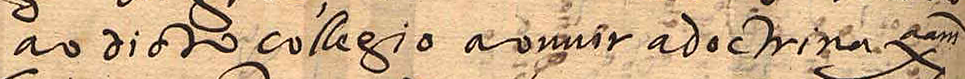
ao dicto collegio a ouuir a doctrina Xaām
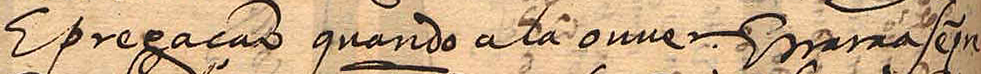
E pregação quando a la ouuer. E traraa sēpre
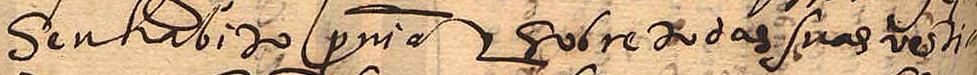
Seu habito pn̄iaL sobre todas suas vesti
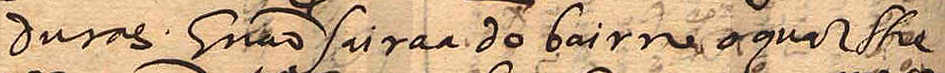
duras. E não sairaa do bairro o qual lhe
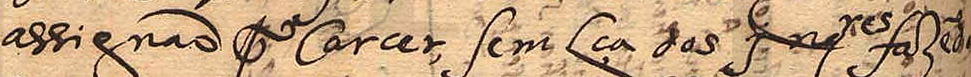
assignão p̄o Carcer sem Lça dos Jnqres fazēdo
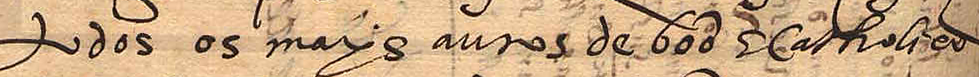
todos os mays autos de bōo E Catholico
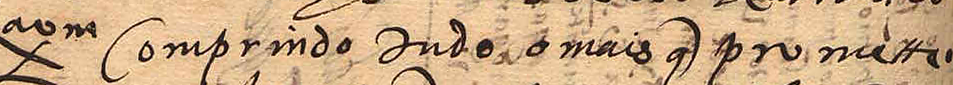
Xaom Comprindo tudo o mais q̄ prometteo
